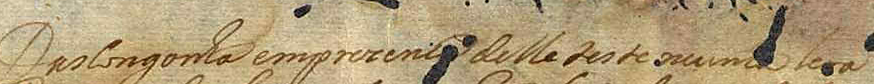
Das Congonha em prezença delle testemunha hera
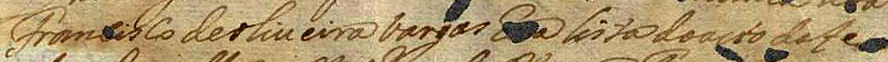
Francisco de oliueira vargas E_a lista do acto de fe
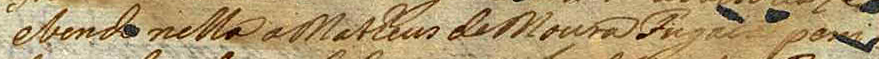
e vendo nella a Matheus de Moura Fugaça peni
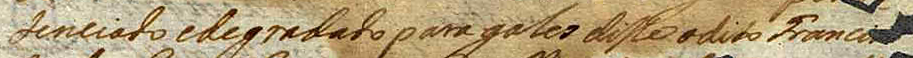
tenciado e degradado para gales disse o dito Franci
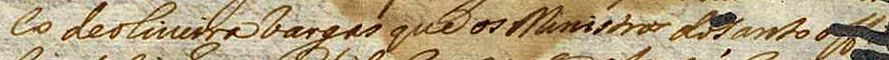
Co de oliueira Vargas que os Ministros do santo off
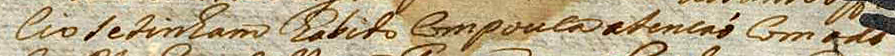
Cio se tinham habito Com pouca atençaõ Com o di
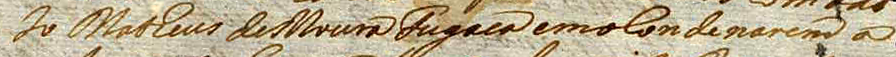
to Matheus de Moura Fugaça em o Condenarem a
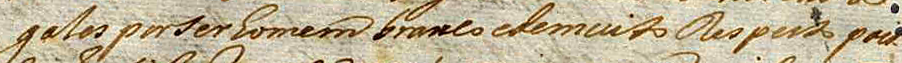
gales por ser homem branco e de muito Respeito pois
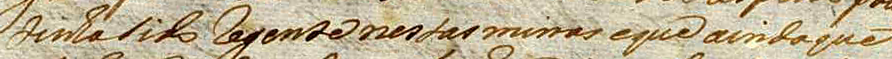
tinha sido Regente nestas minas e que ainda que
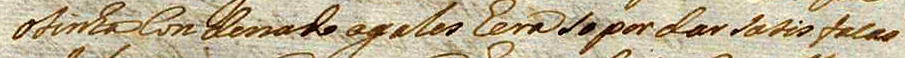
o tinha Condenado a gales hera so por dar satisfaçao
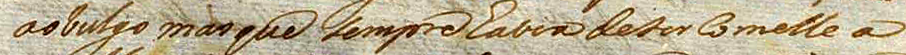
ao Vulgo mas que sempre havia de ter com elle a
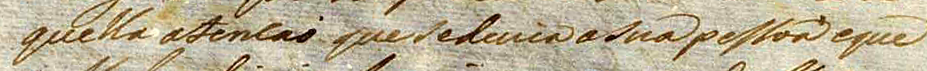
quella atençaõ que se deuia a sua pessoa e que
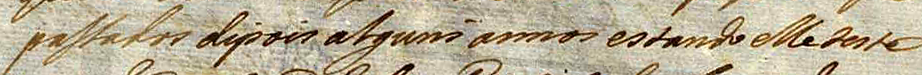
passados dipois alguns annos estando elle teste
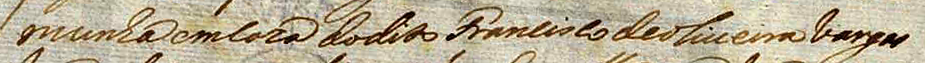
munha em caza do dito Francisco de oliueira vargas
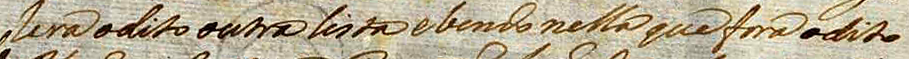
lera o dito outra lista, e vendo nella que fora o dito
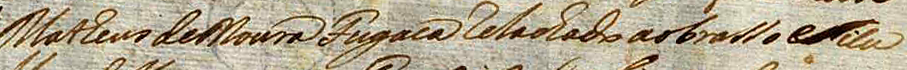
Matheus de Moura Fugaça Relachado ao brasso sicu
